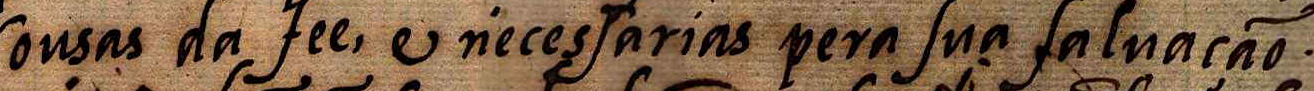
Cousas da fee, e necessarias pera sua saluação.
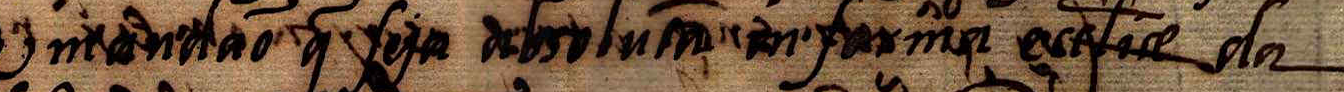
e mandaõ q̄ seja absoluta en forma eccl̄iæ da
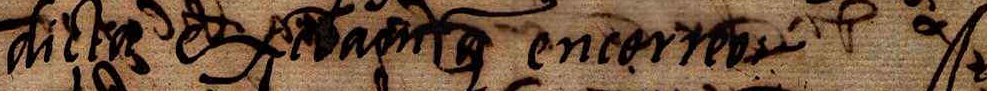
dicta excōam q̄ encorreo
